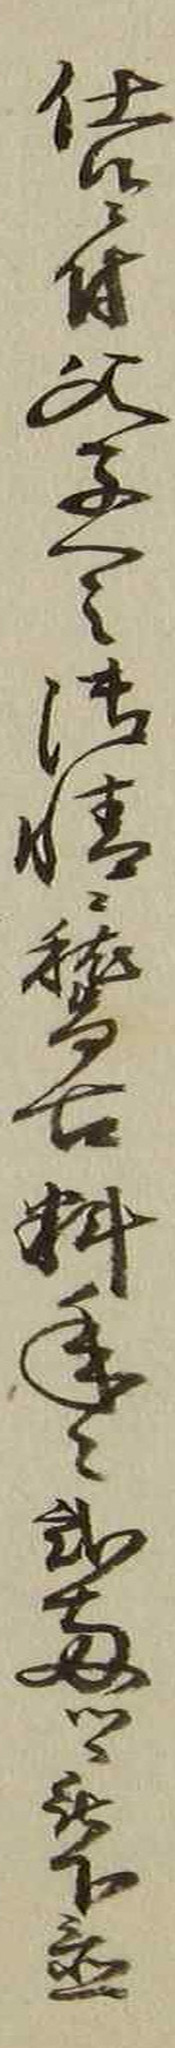仕候ニ付父子へ之御情ニ稽古料年々弐両ツヽ被下置
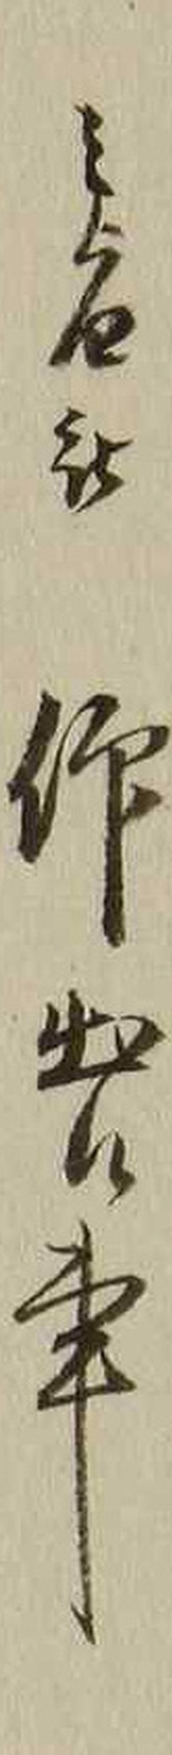候旨被仰出候事
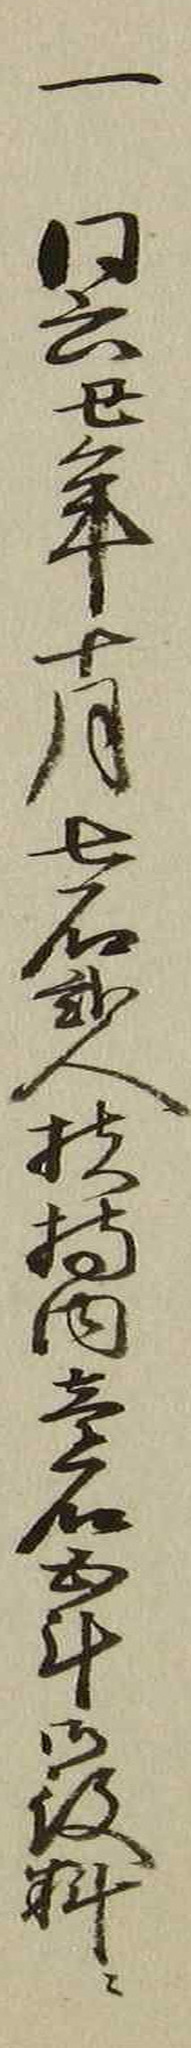一同六丑年十月七石弐人扶持内壱石五斗御役料ニ
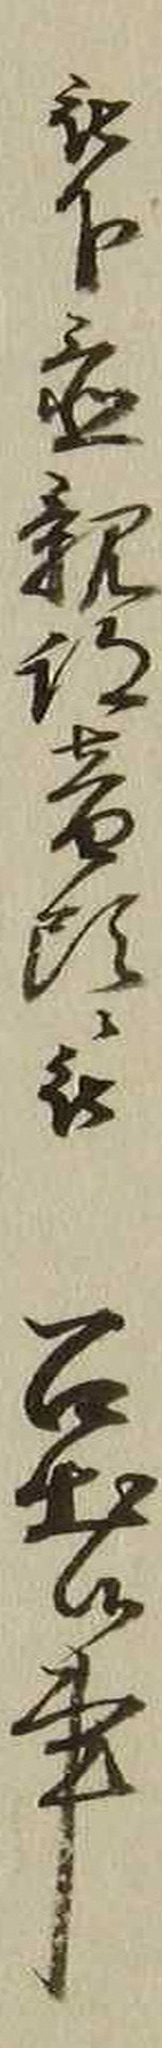被下置親跡音頭ニ被召出候事
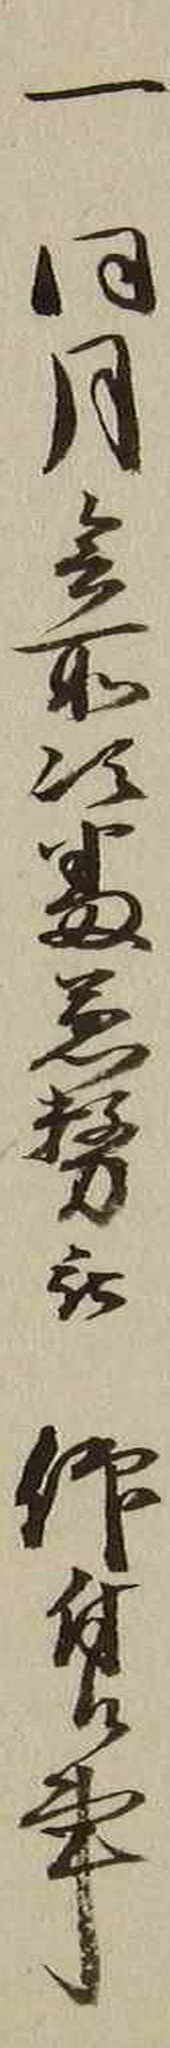一同月会所次番兼務被仰付候事
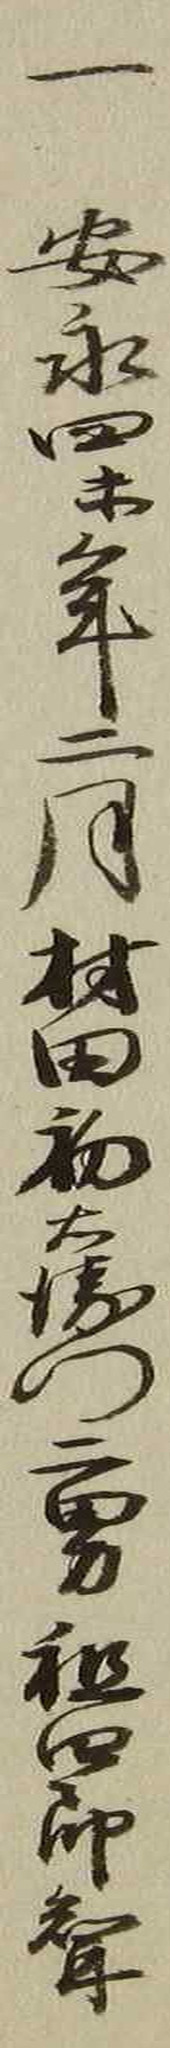一安永四未年二月村田初右衛門二男祖四郎婿
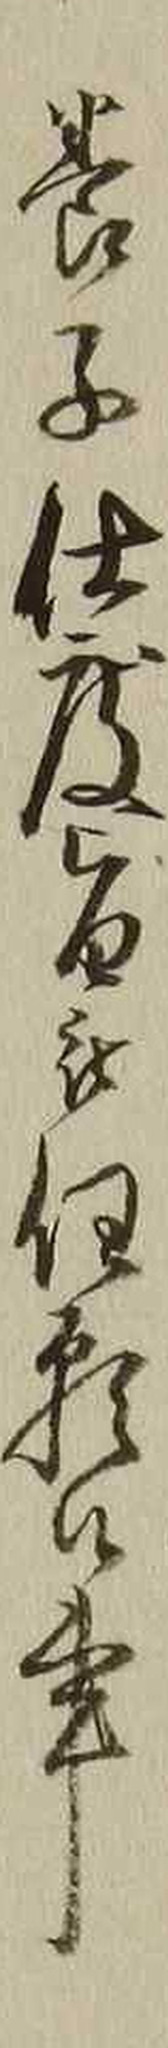養子仕度旨被任願候事
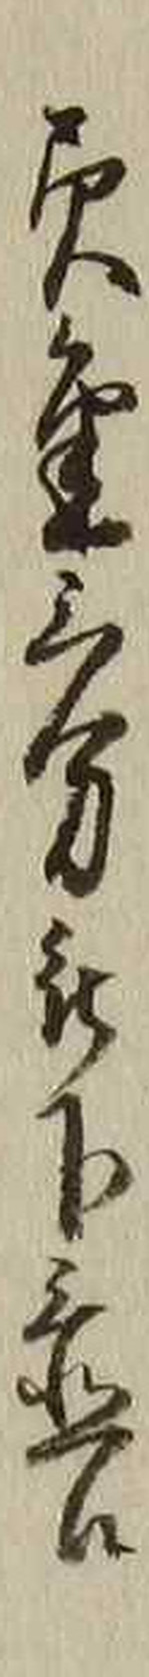美金三分被下置候
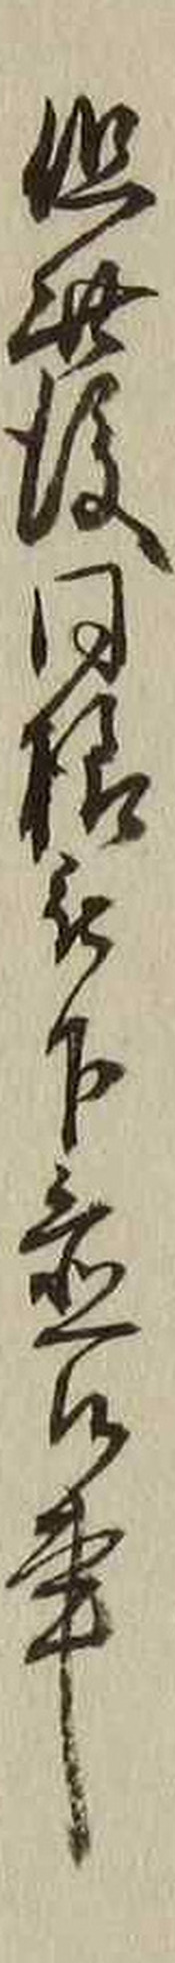但此後同様被下置候事
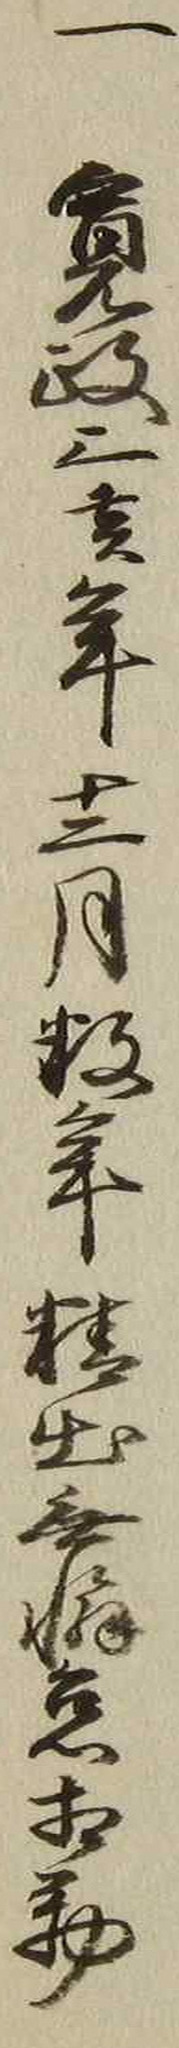一寛政三亥年十二月数年精出無懈怠相勤
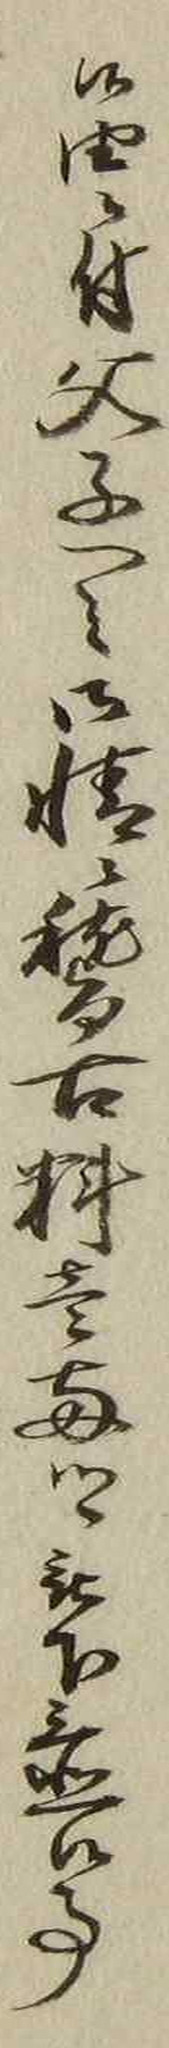候由ニ付父子へ之御情ニ稽古料壱両ツヽ被下置候事
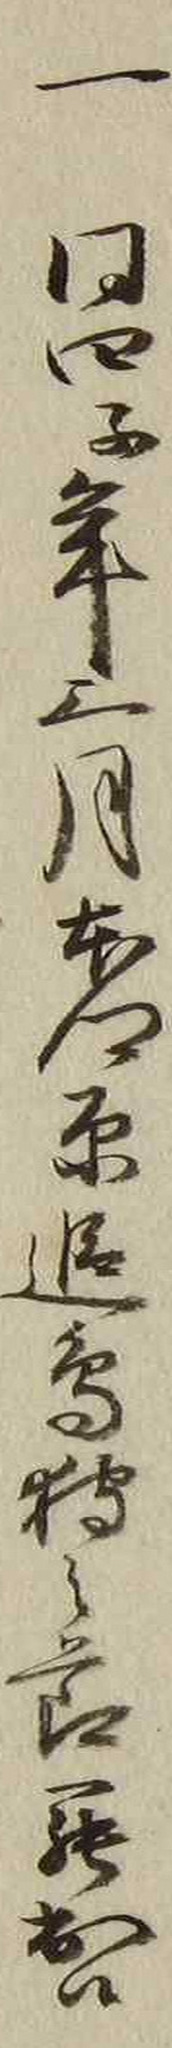一同四子年三月本郷原追鳥狩之節罷出候
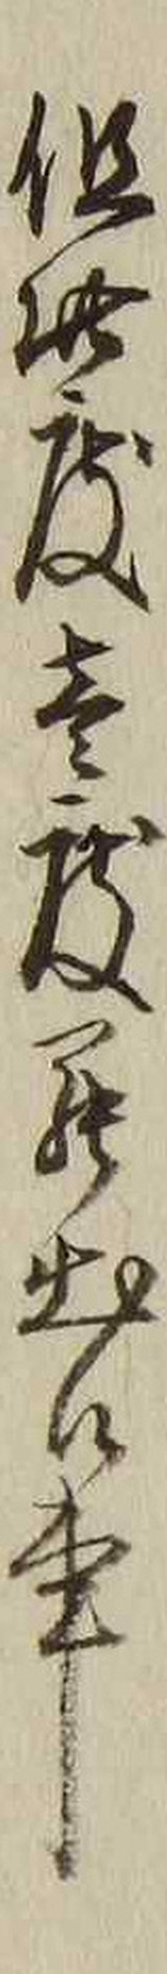但此度壱度罷出候事
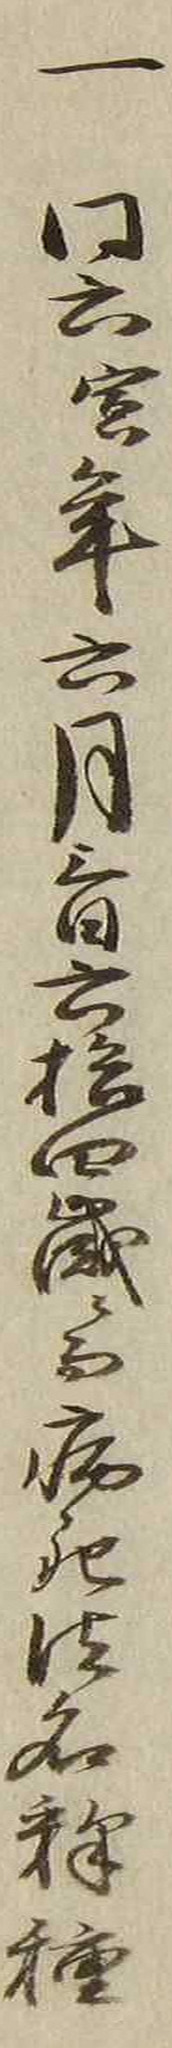一同六寅年六月三日六拾四歳ニ而病死法名釈種
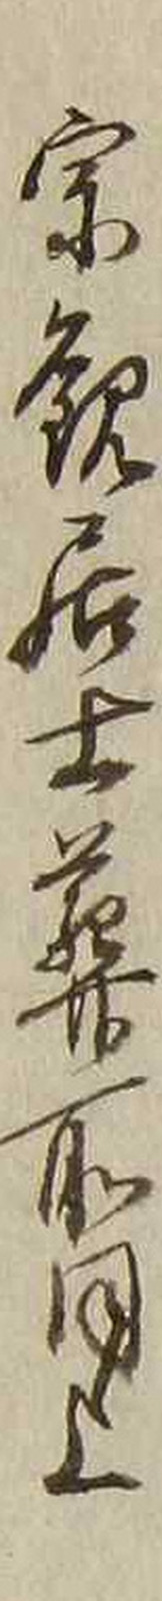宗観居士葬所同上

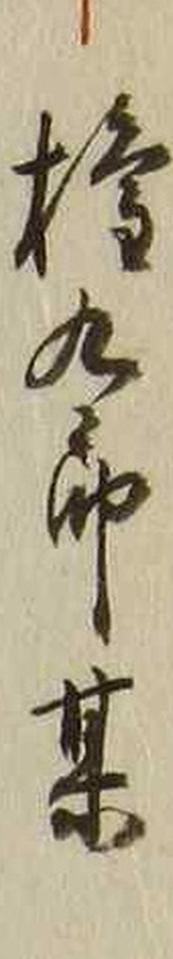権九郎某
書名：諸士系譜　巻之102　か之部10
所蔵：会津若松市立会津図書館
